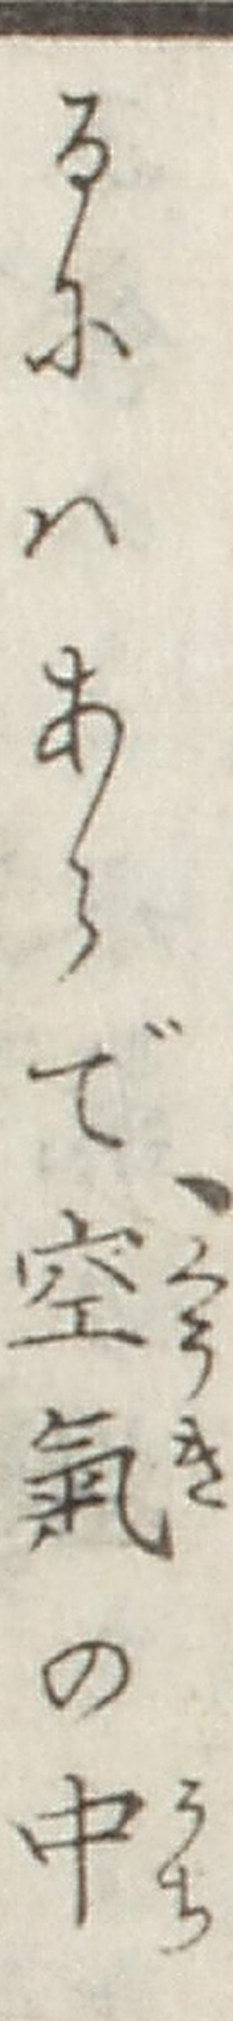るにはあらで、空気の中

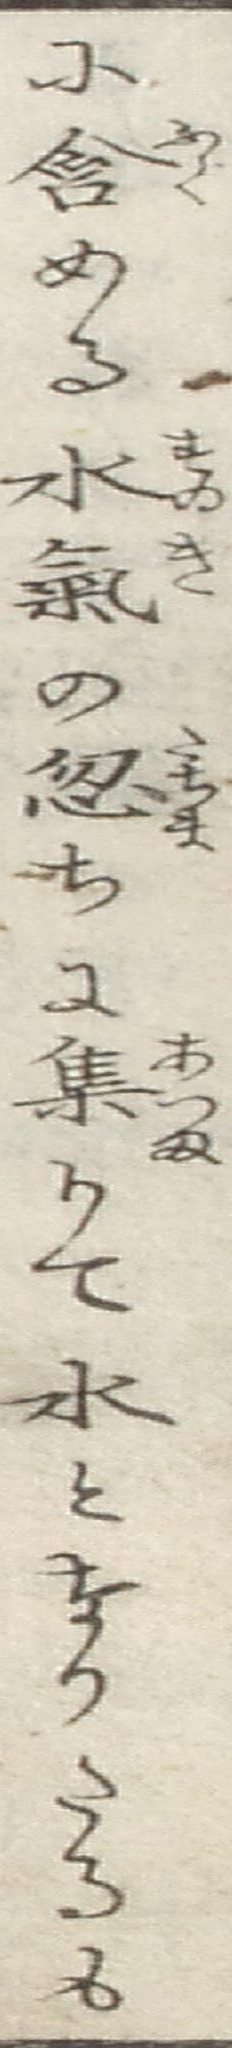に含める水気の忽ちに集りて水となりたるも
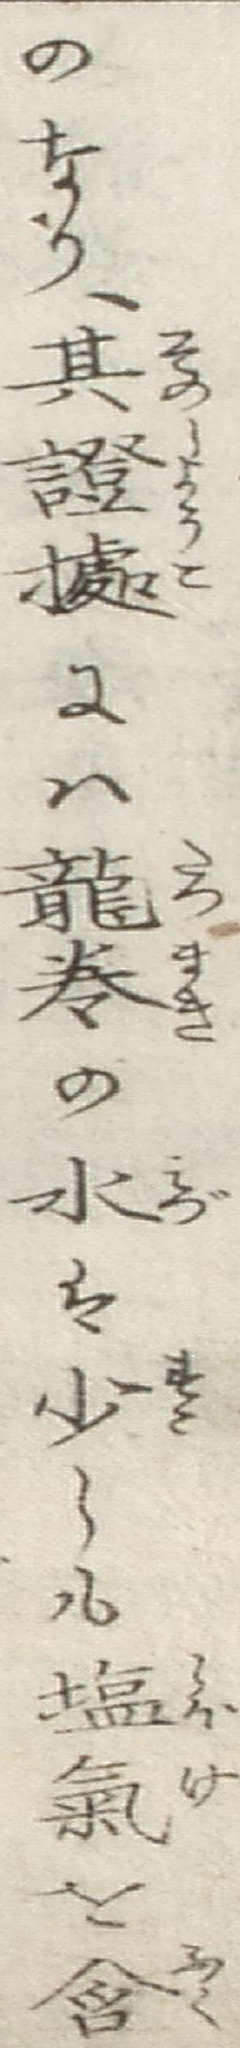のなり、其証拠には龍巻の水は少しも塩気を含
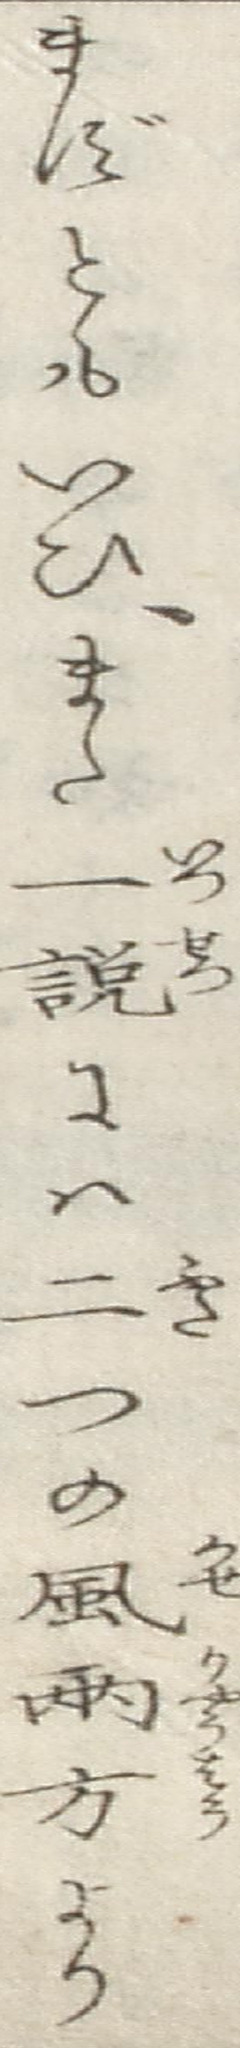まずともいひ、また一説には二つの風両方より
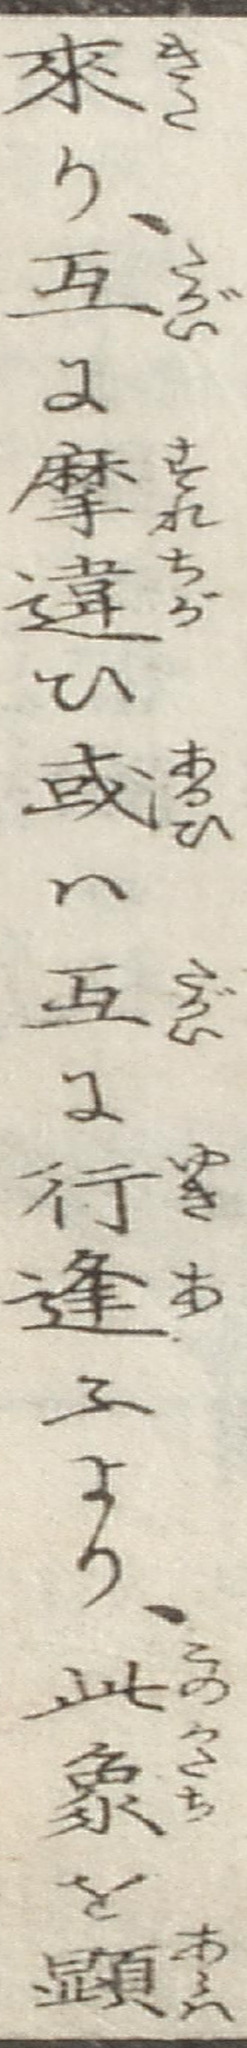来り、互に摩違ひ或は互に行逢ふより、此象を顕
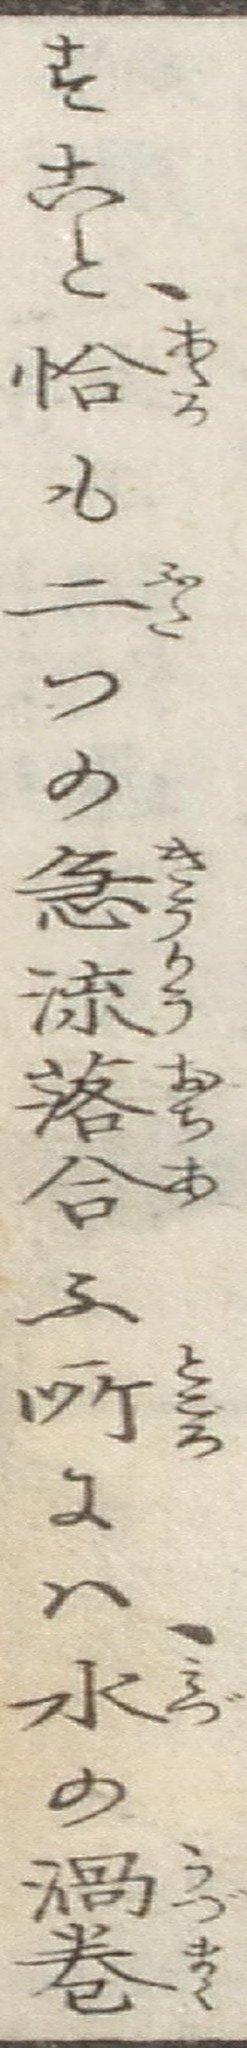すこと、恰も二つの急流落合ふ所には、水の渦巻
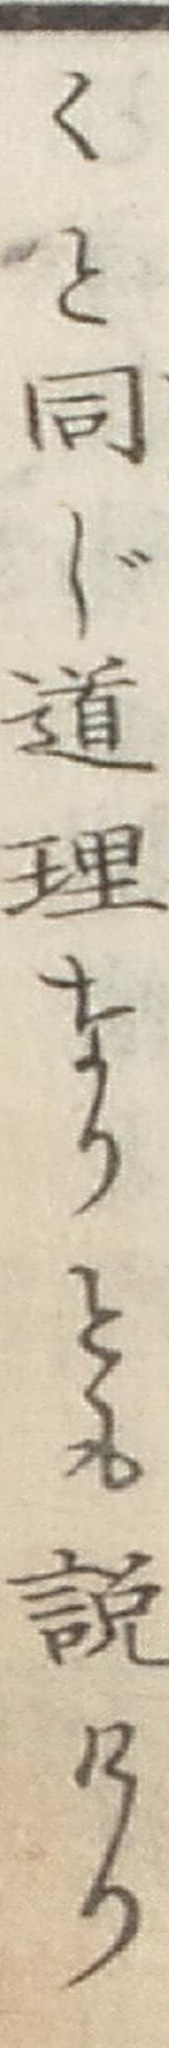くと同じ道理なりとも説けり
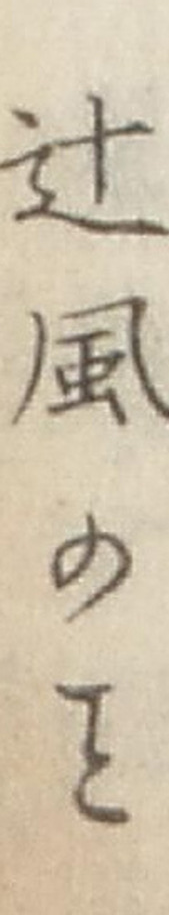辻風のこと
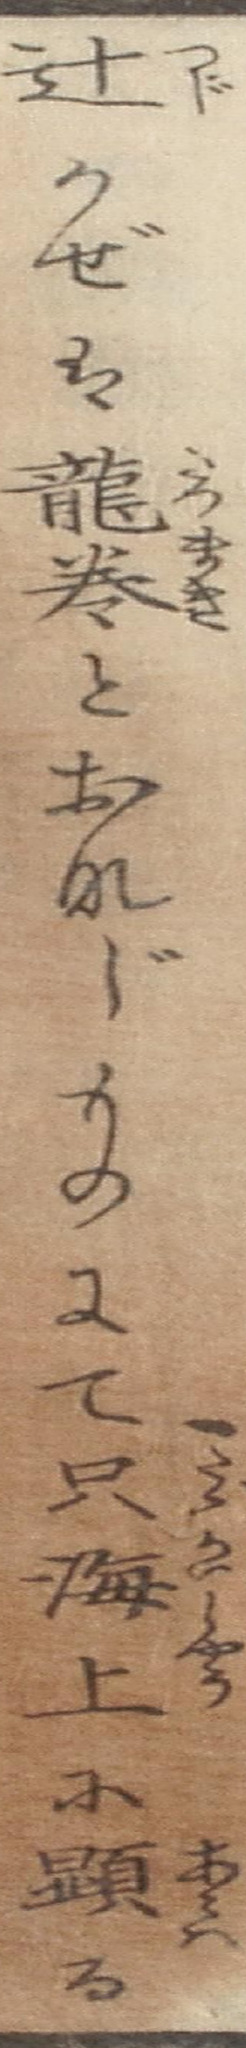辻かぜは龍巻とおなじものにて、只海上に顕る
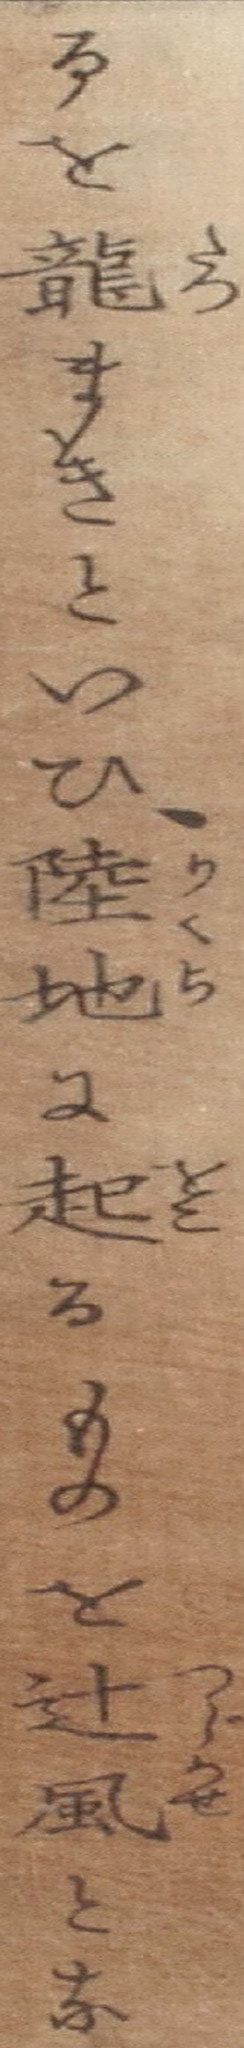るを龍まきといひ、陸地に起るものを辻風とな
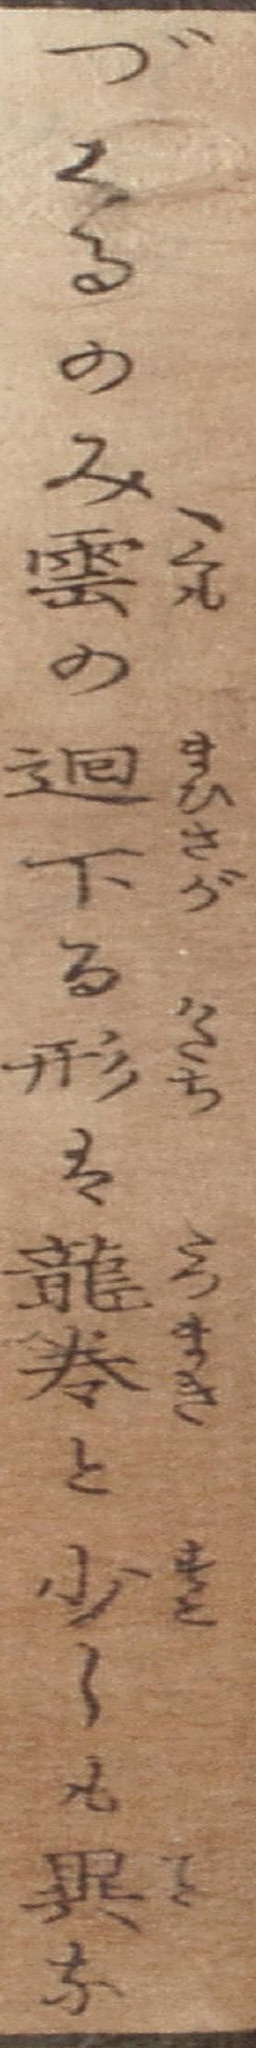づくるのみ、雲の廻下る形は龍巻と少しも異な
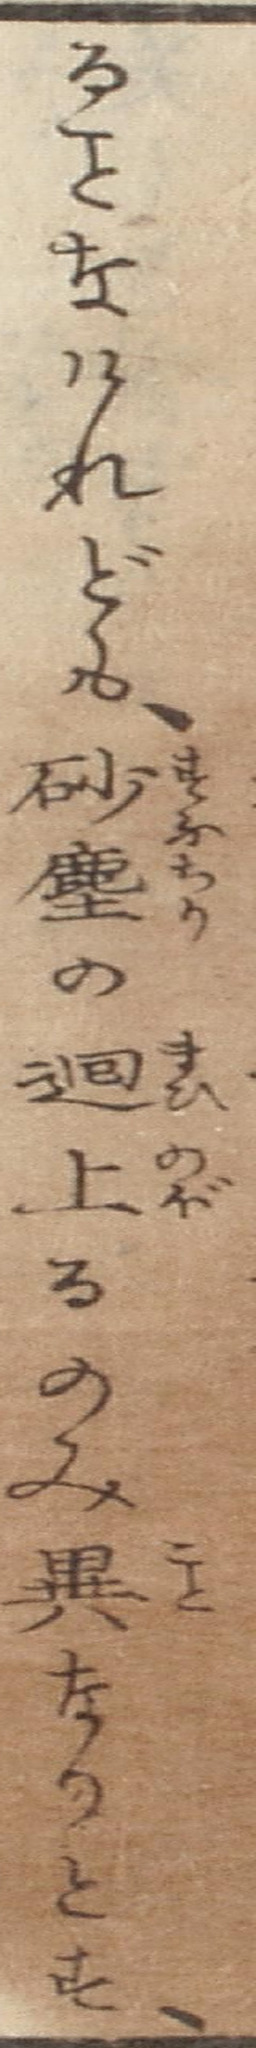ることなけれども、砂塵の廻上るのみ異なりとす、
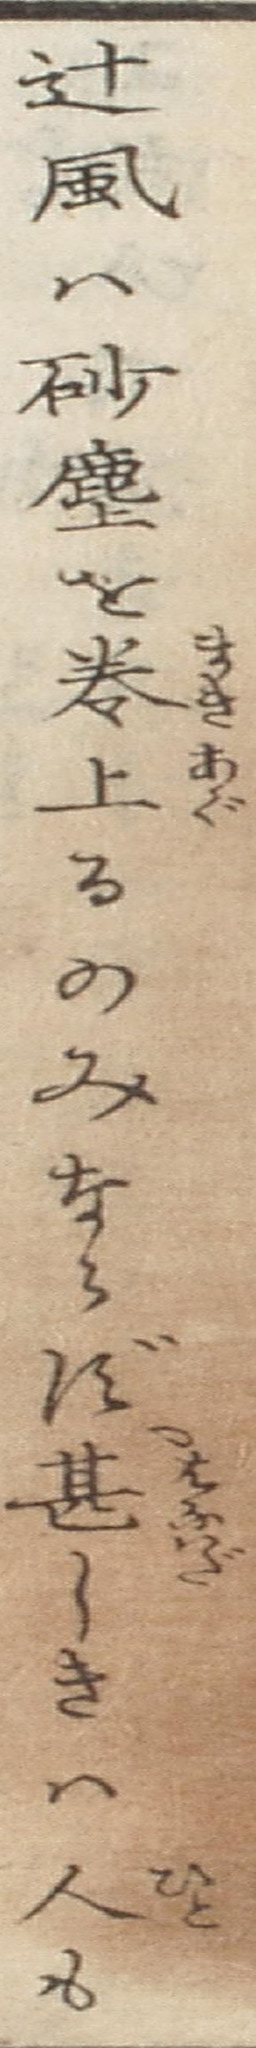辻風は砂塵を巻上るのみならず甚しきは人も
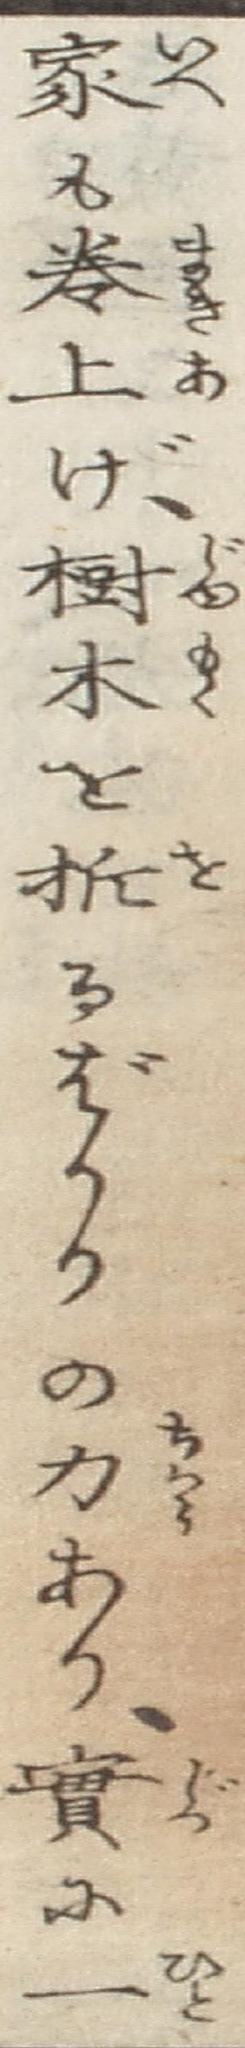家も巻上げ、樹木を折るばかりの力あり、実に一
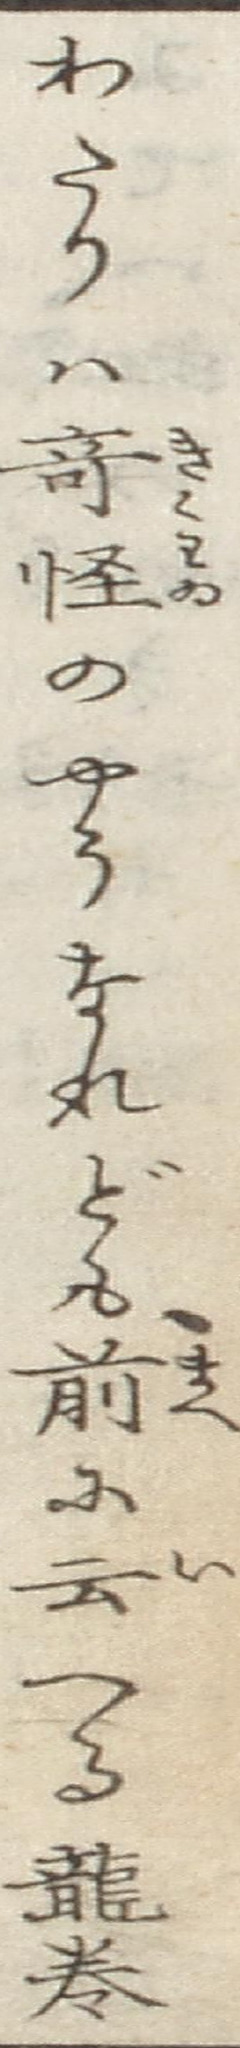わたりは奇怪のやうなれども、前に云へる龍巻
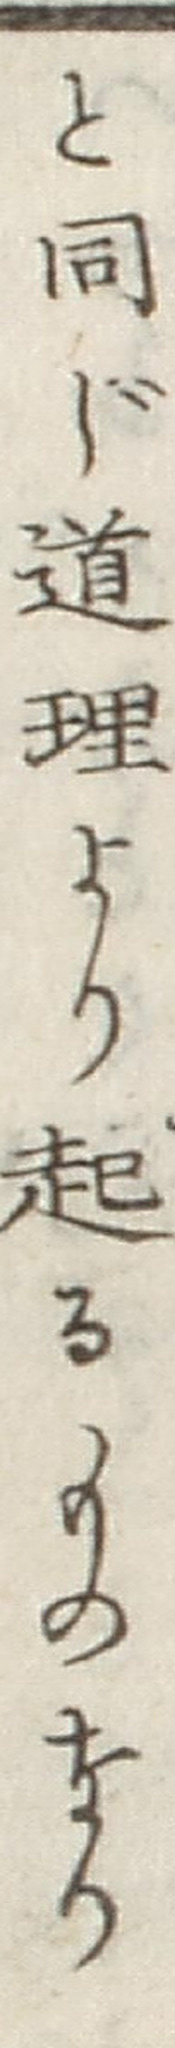と同じ道理より起るものなり
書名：変異辯　一名、天變地異拾遺　全
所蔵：東京大学地震研究所図書室 Earthquake Research Institute Library, The University of Tokyo, JAPAN
